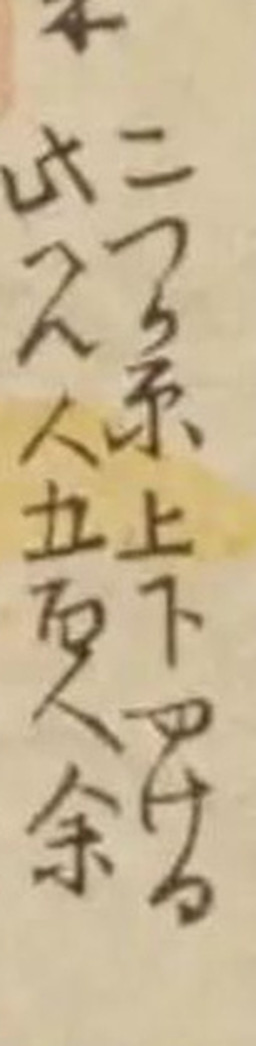此へん人五百人余
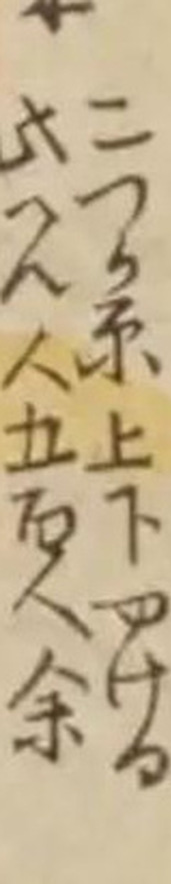此へん人五百人余
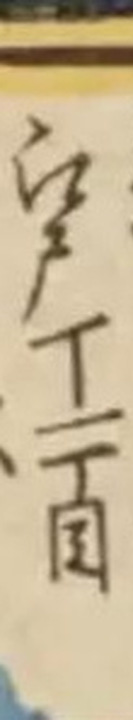江戸丁一丁目
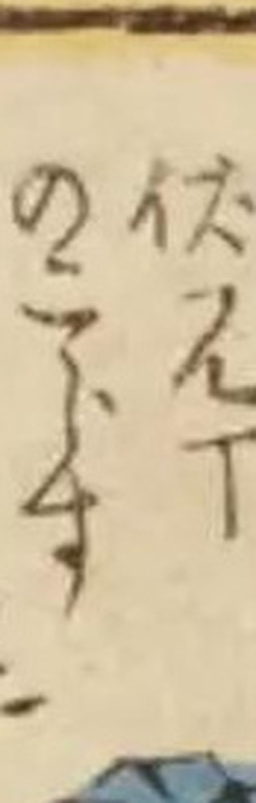のこらす
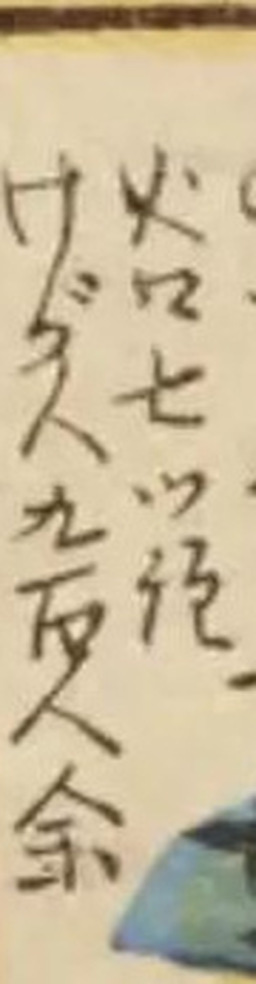けが人九百人余
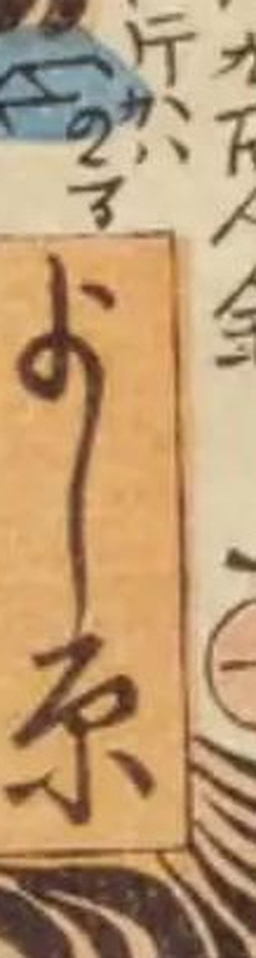よし原
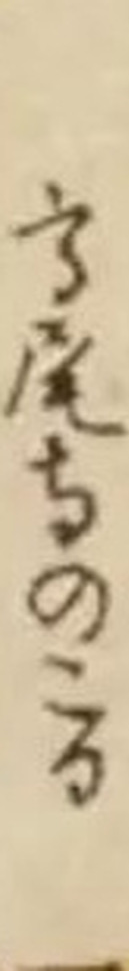鳥尾寺のこる
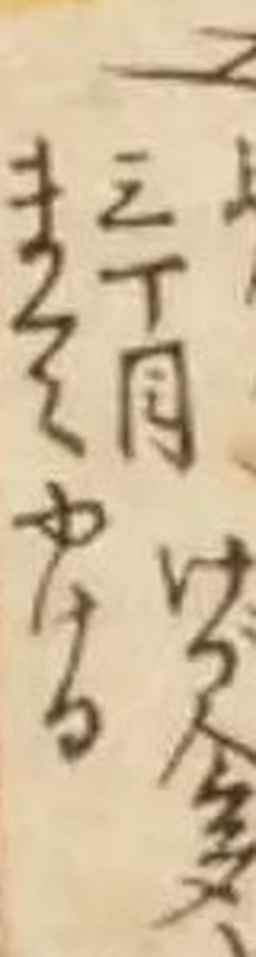まてやける
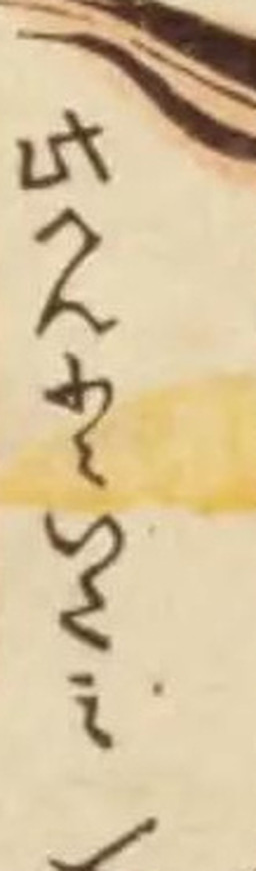此へん少々いたみ
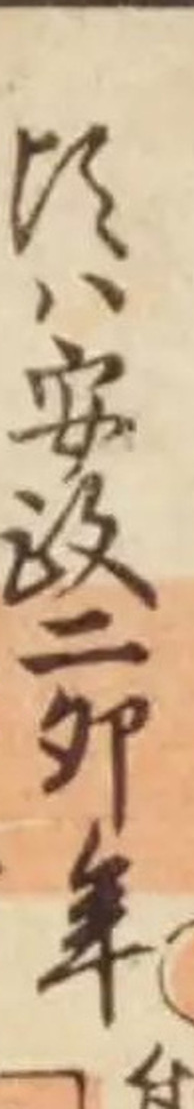頃は安政二卯年
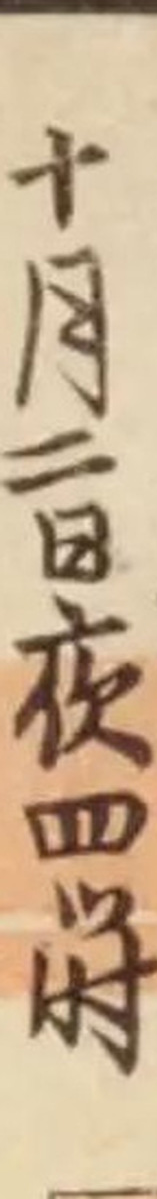十月二日夜四つ時
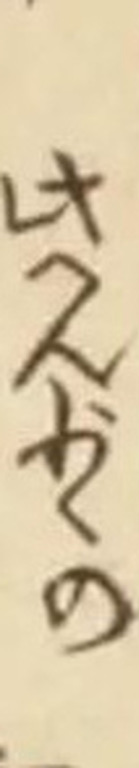此へん少々の
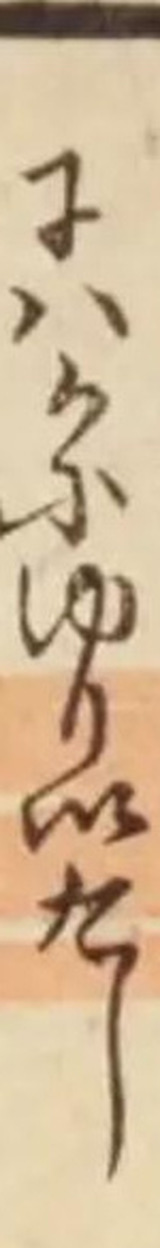にはかにゆりいたし
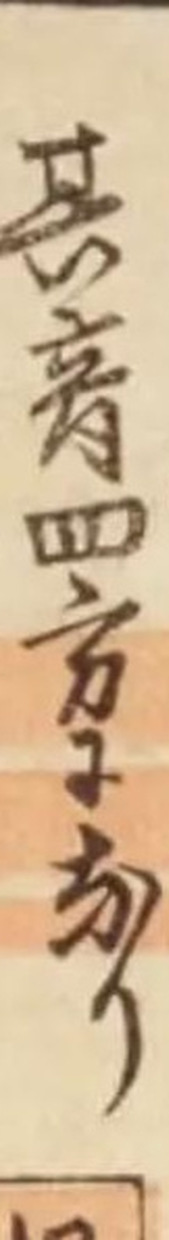其音四方になり
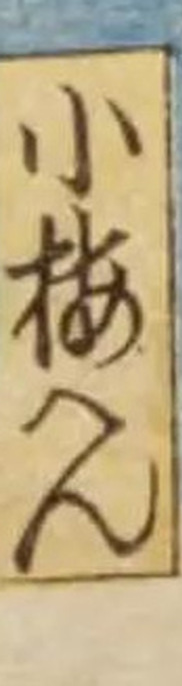小梅へん
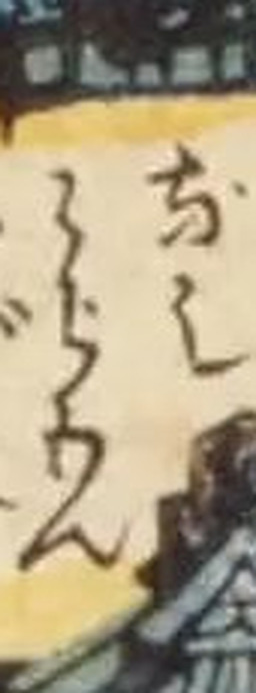うらもん
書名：銘細改板江戸大地震出火場所附
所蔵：国立国会図書館 National Diet Library, JAPAN
